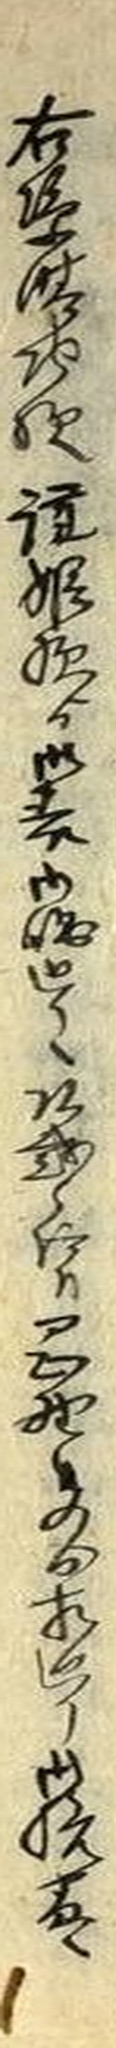右涼晴院様謹姫様ゟ御表御側廻りへ頂戴被仰付岡野とのゟ相廻り御膳番へ
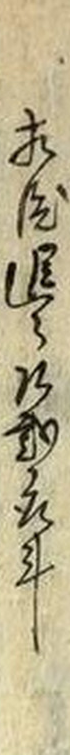相渡追々頂戴取斗
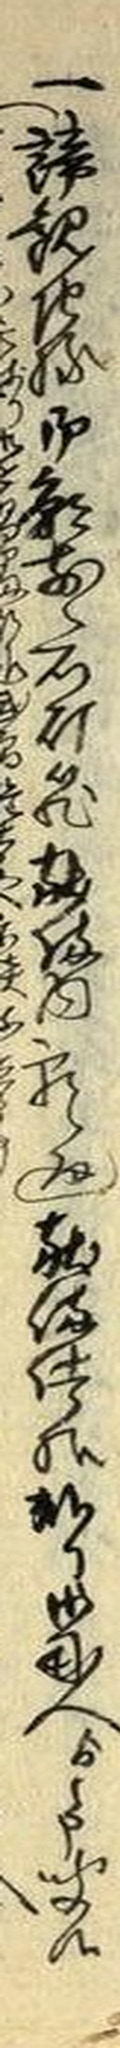一諦観院様御廟前へ石灯籠献備内願之通献備仕候様掛り御用人ゟ被申聞候
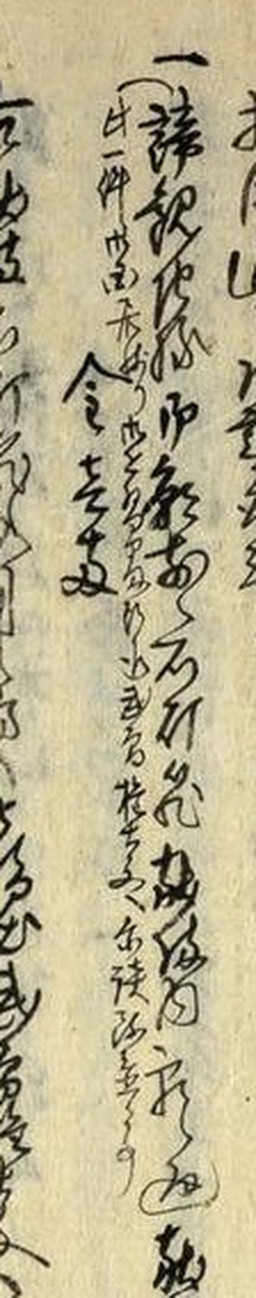此一件御国居残り御近習番頭取武曾権太夫へ示談致置候事
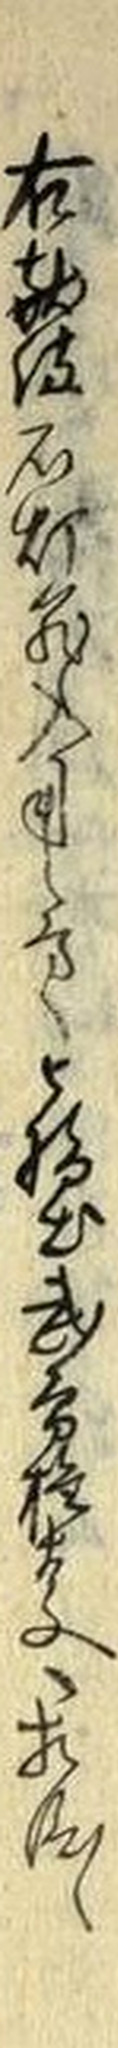右献備石灯籠入用之方へ被指出武曽権太夫へ相渡候
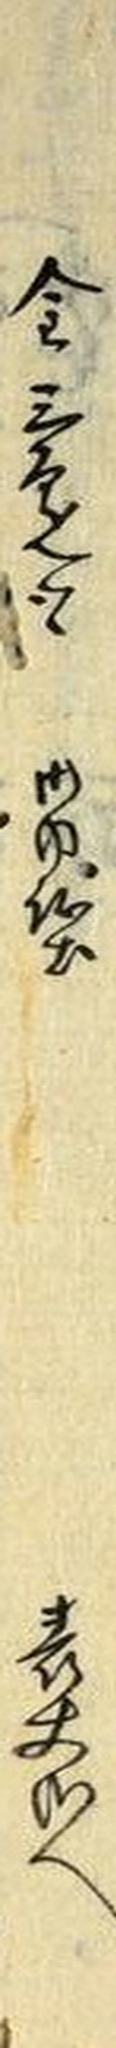金三百疋ツヽ御内証出表使弐人
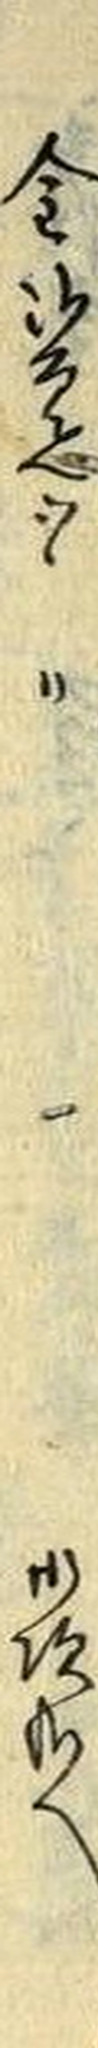金弐百疋ツヽ同御次弐人
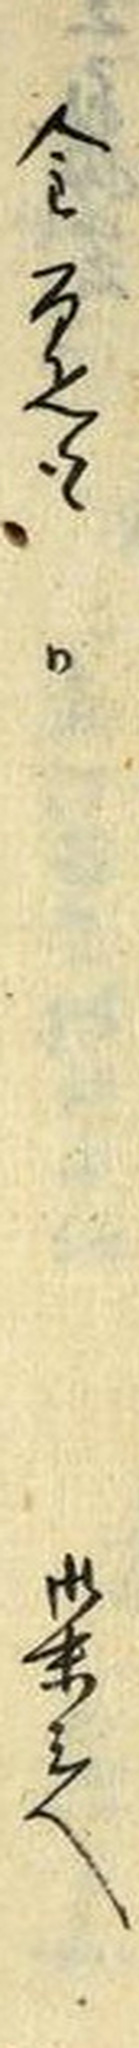金百疋ツヽ同御未三人
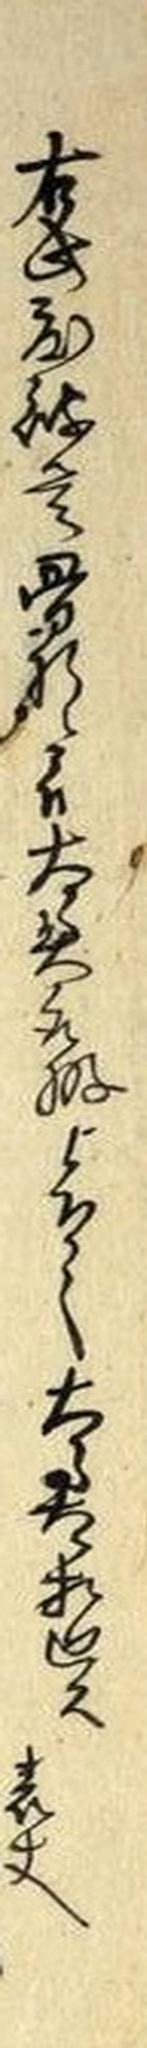右此度彼是骨折候ニ付大奥取扱被下之大奥相廻ス
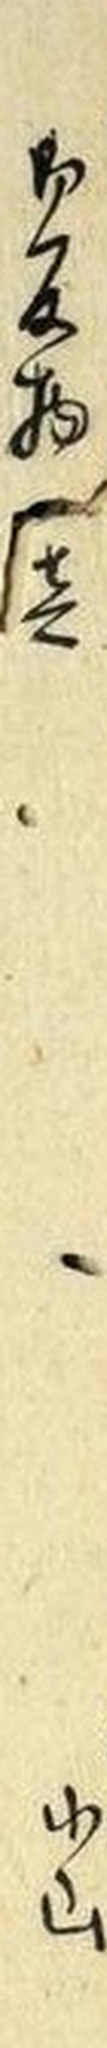御反物壱表使小山
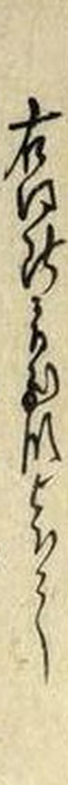右同断ニ付別段被下之
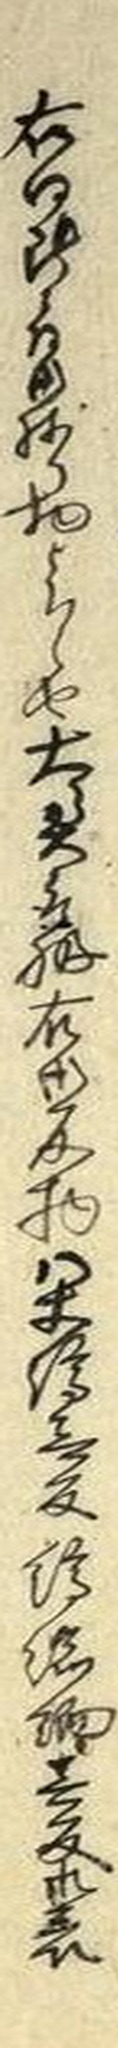右同断ニ付御残物被下候由大奥取扱右御反物八丈縞壱反縞縮緬壱反御表
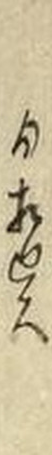ゟ相廻ス
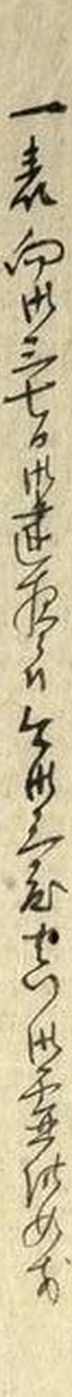一表向御三七日御逮夜ニ付今御三度真御霊供如前
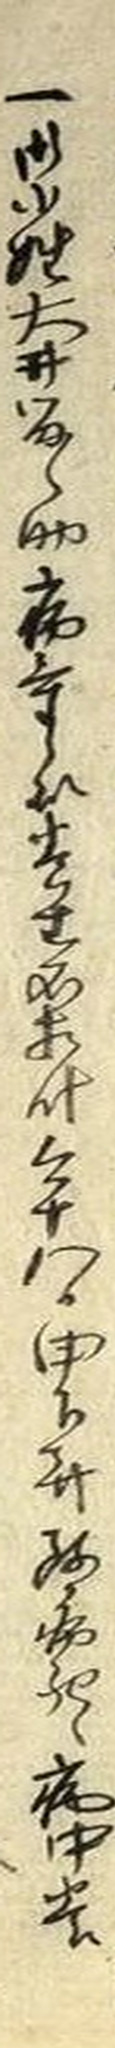一御小姓大井留之助病気候処養生不相叶今十八日申下刻致病死候病中養
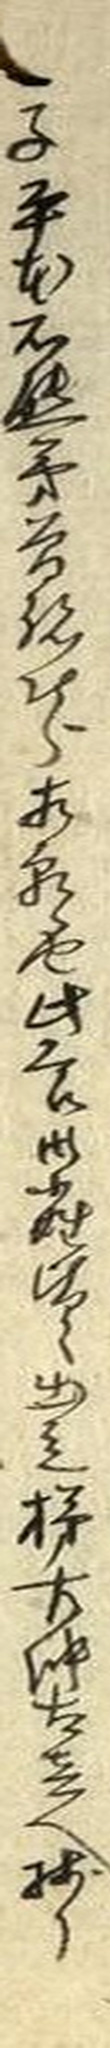子平本石熊弟曽弥次郎相願候由此節御小姓皆々出立梯左仲太壱人残り
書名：少傅日録抄（斉善付側向頭取日記、江戸并道中、初入在国、逝去後…
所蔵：福井県文書館 Fukui Prefectural Archives
